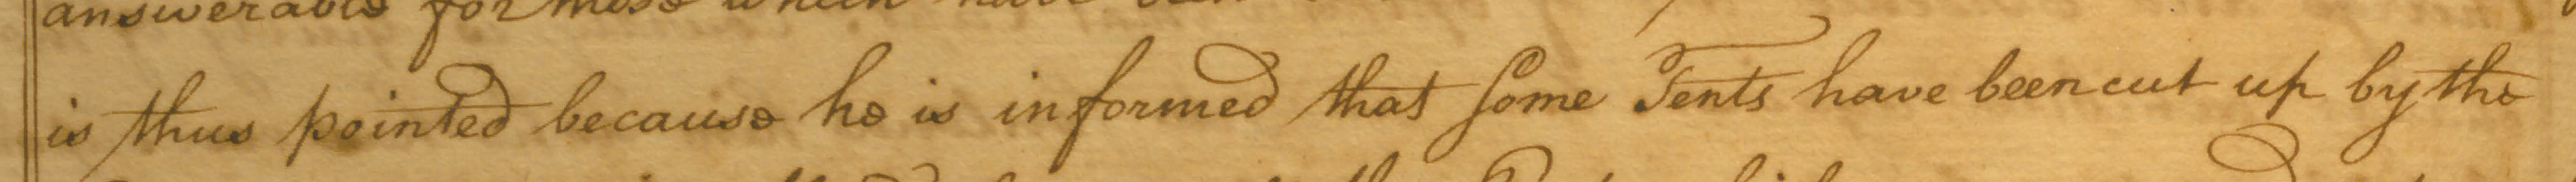is thus pointed because he is informed that some Tents have been cut up by the
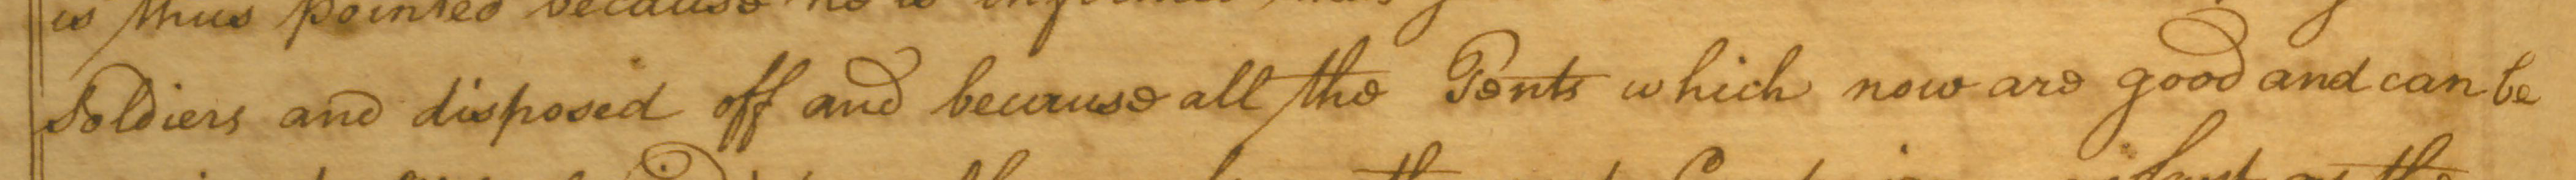soldiers and disposed off and because all the Tents which now are good and can be
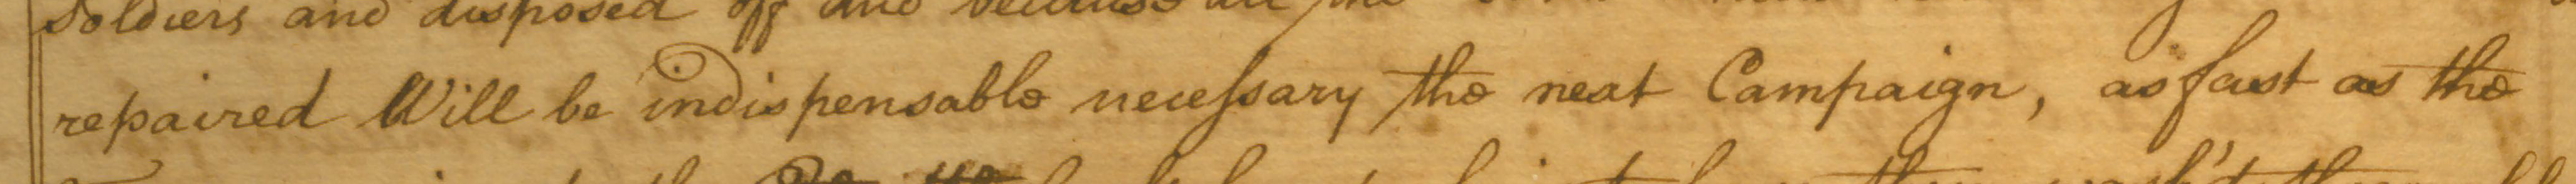repaired Will be indispensable necessary the next Campaign, as fast as the
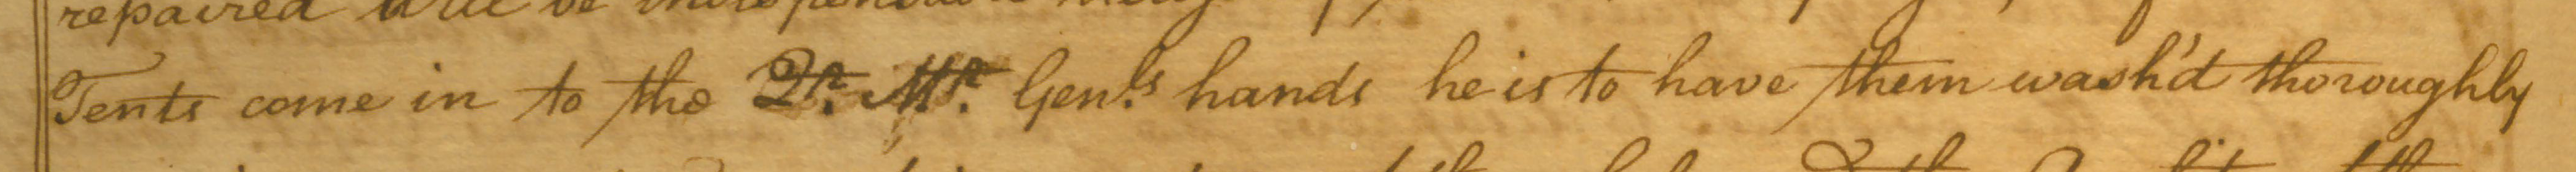Tents come in to the Q^r. M^r. Gen^ls. hands he is to have them wash'd thoroughly
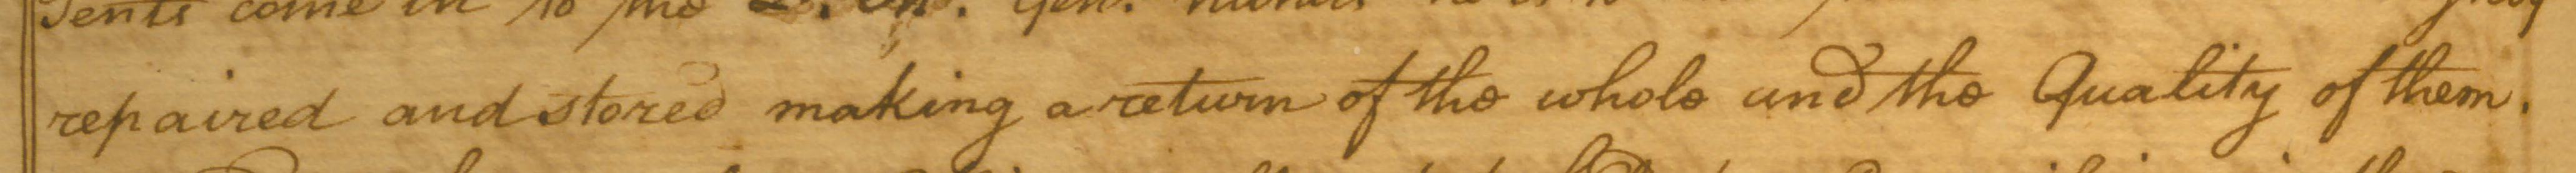repaired and stored making a return of the whole and the Quality of them.
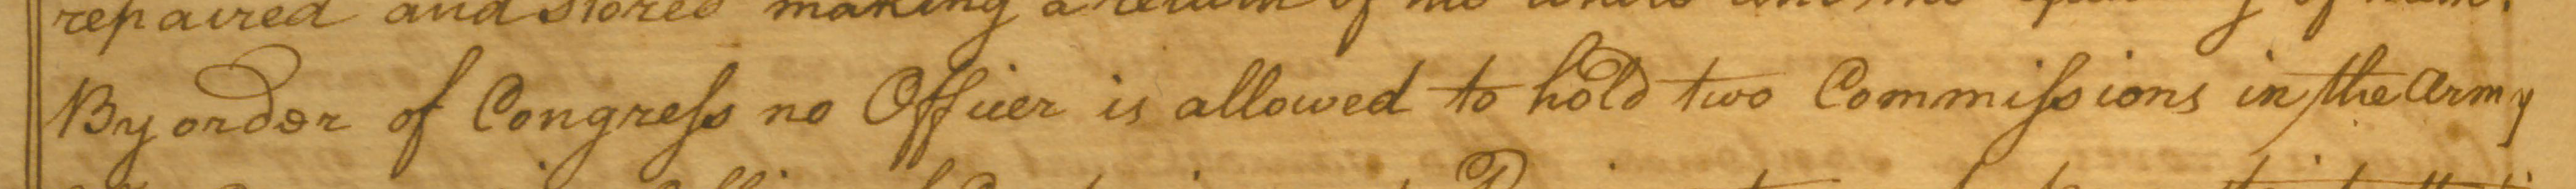By order of Congress no Officer is allowed to hold two Commissions in the Army
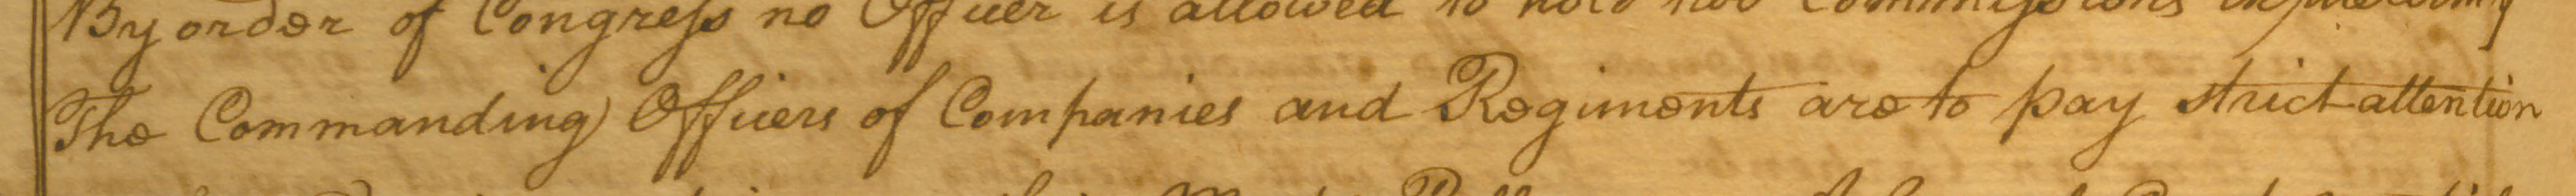The Commanding Officers of Companies and Regiments are to pay strict attention
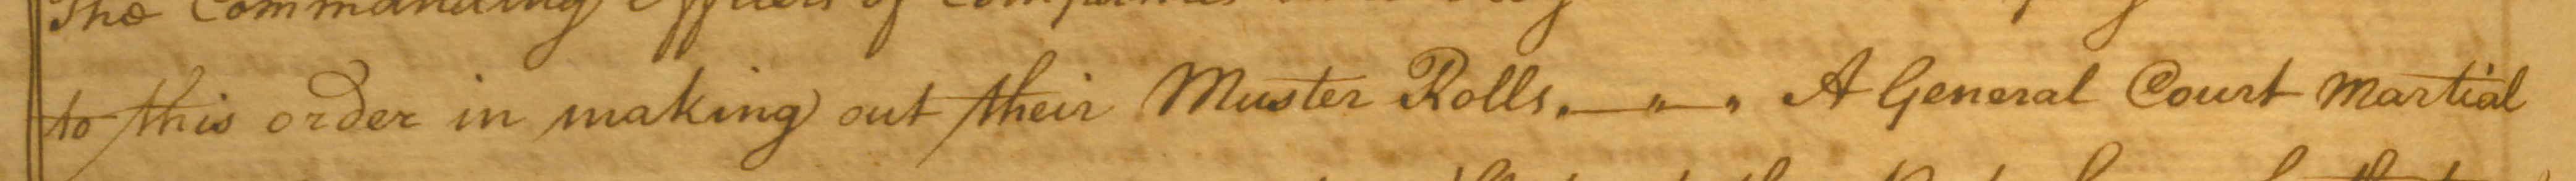to this order in making out their Muster Roles- A General Court martial
